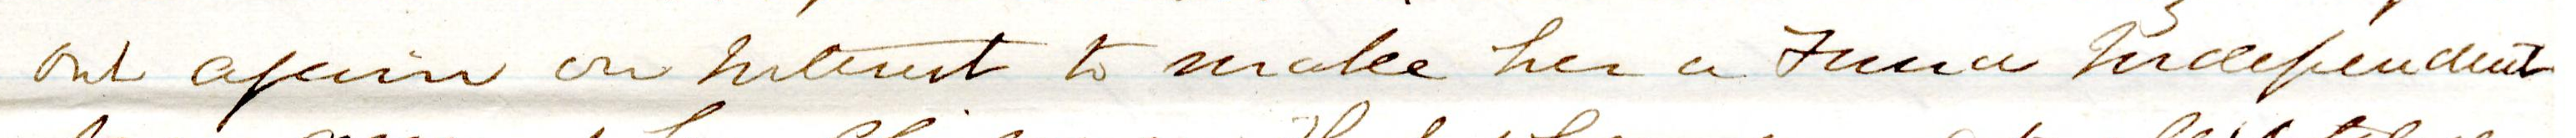out open on interest to make her a Friend Independant
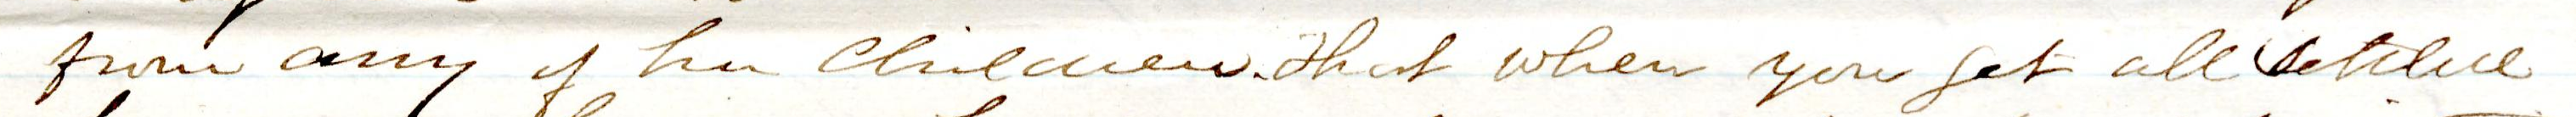from any of her children that when you get all settled
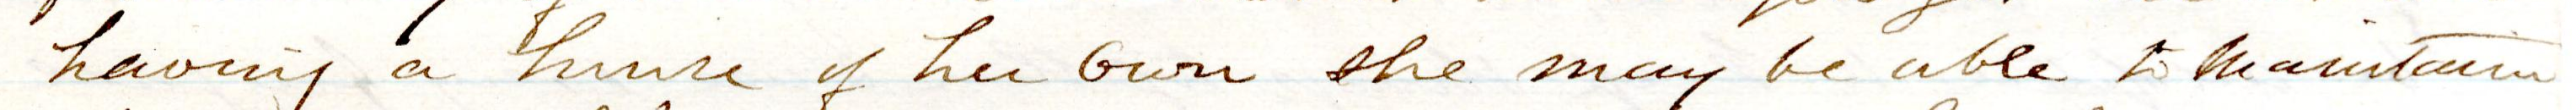having a house of her own she may be able to maintain
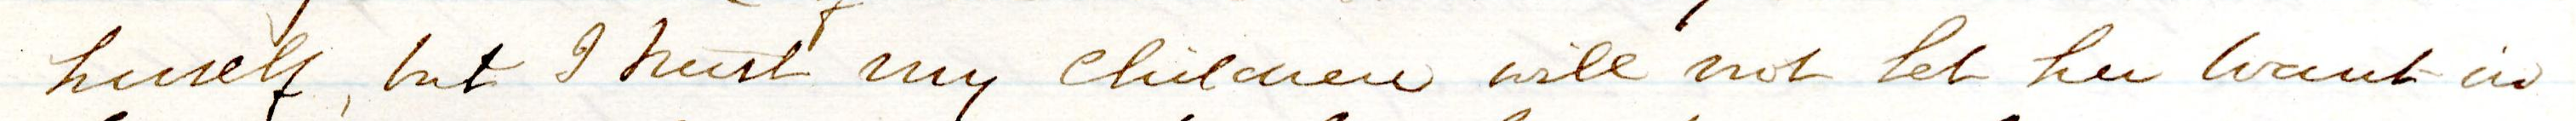herself but I trust my children will not let her want in
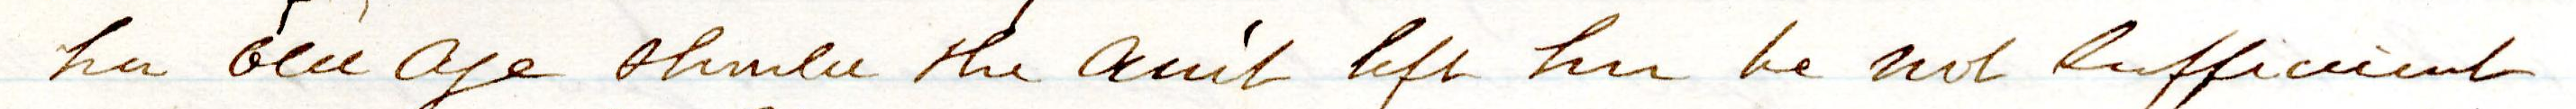her old Age should the acc't left her be not sufficient
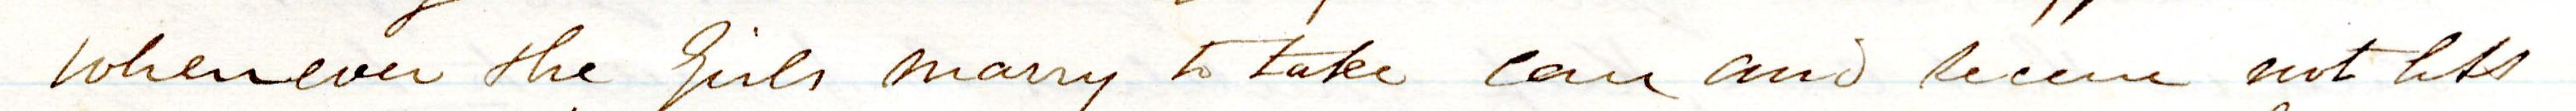whenever the Girls marry to take care and receive acct less
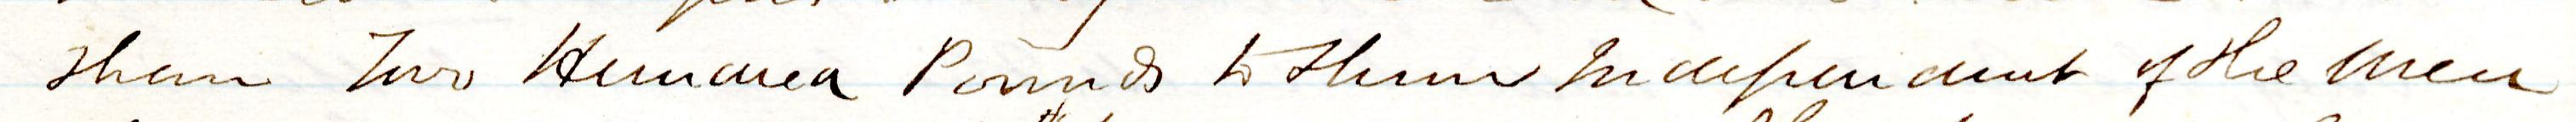then two Hundred Pounds to them in Independent of the men
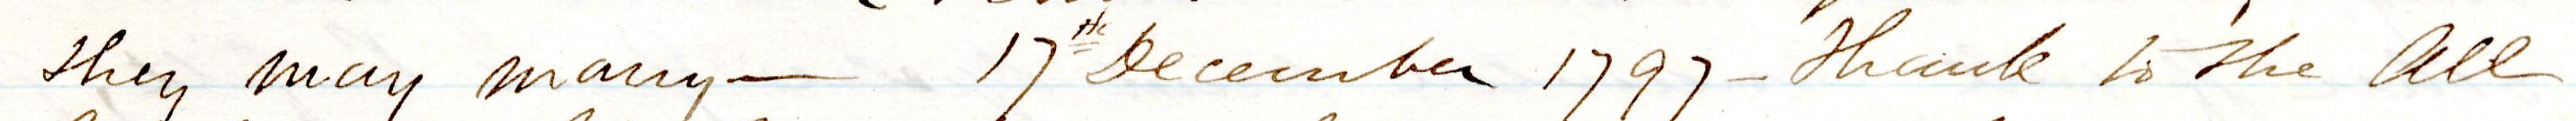they may marry- 17^th December 1797.- Thank to the All
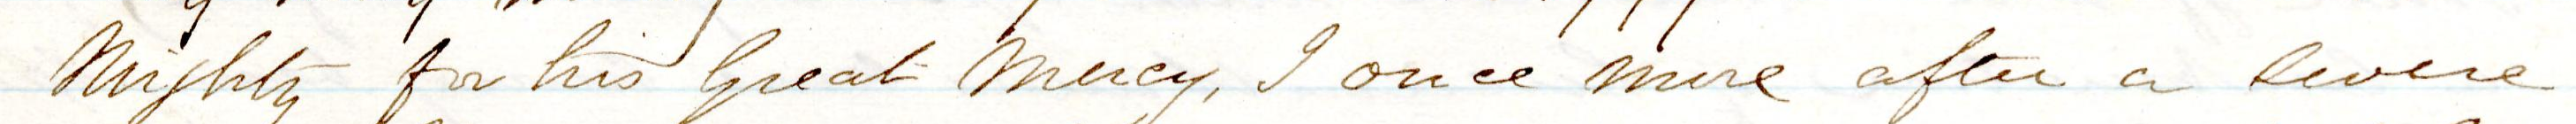Mighty for his Great Mercy, I once more after a severe
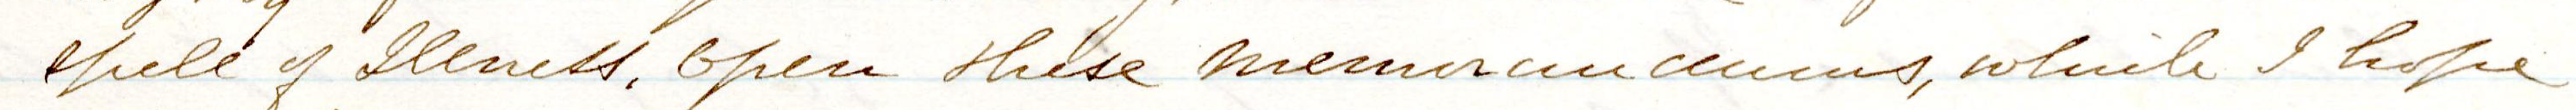spell of Illness, open these memorable accounts, which I hope
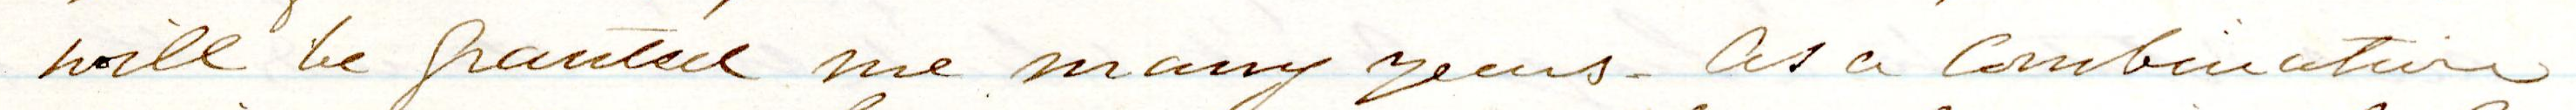will be granted me many years.- As a combination
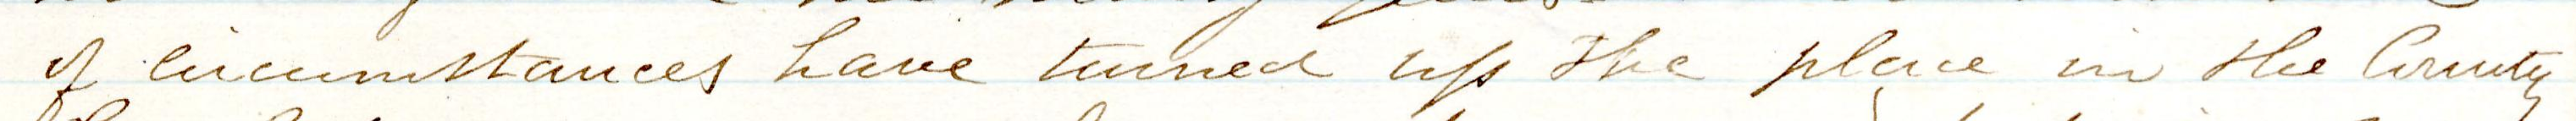of circumstances have turned up the place in the county
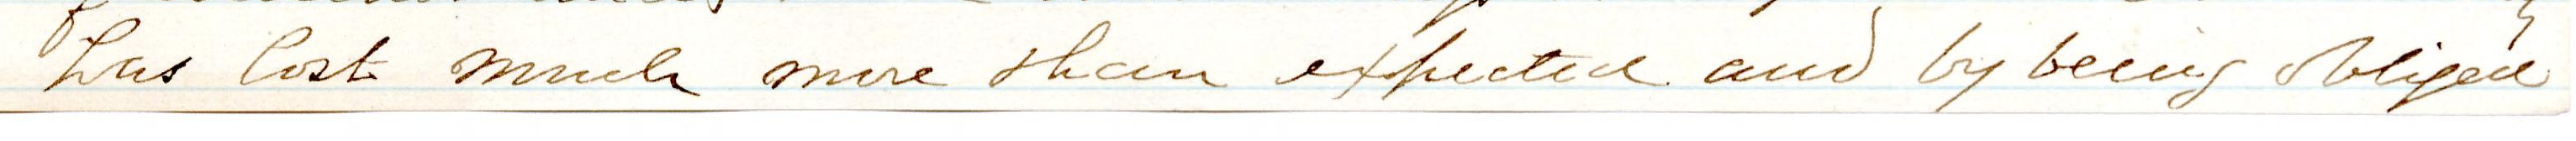has cost much more than expected and by becus obliged
